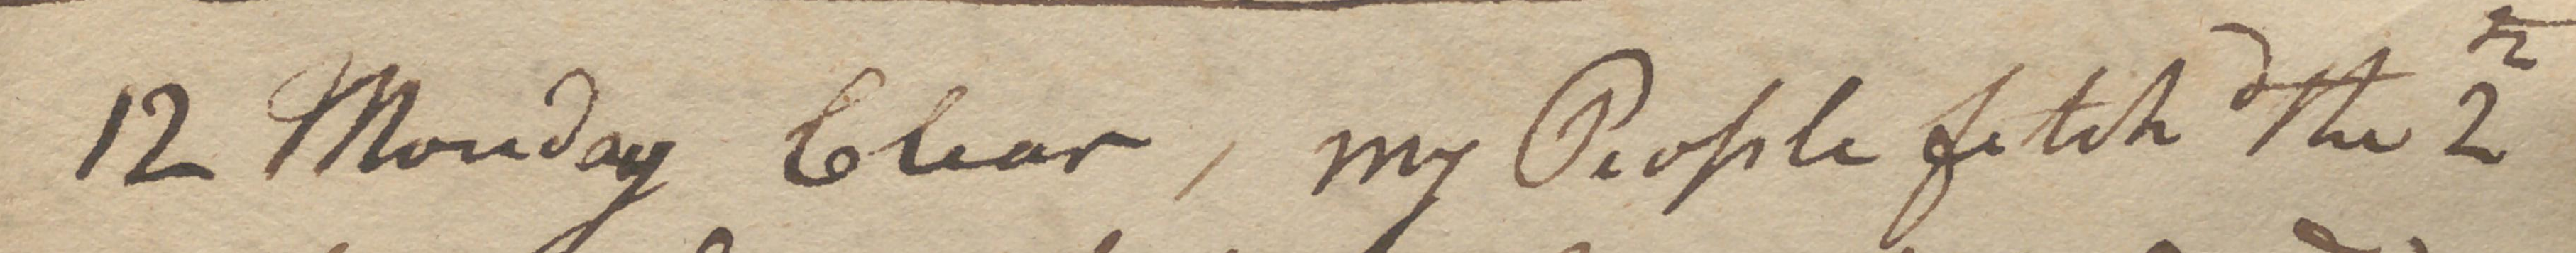12 Monday Clear, my People fetch^d the 2^th
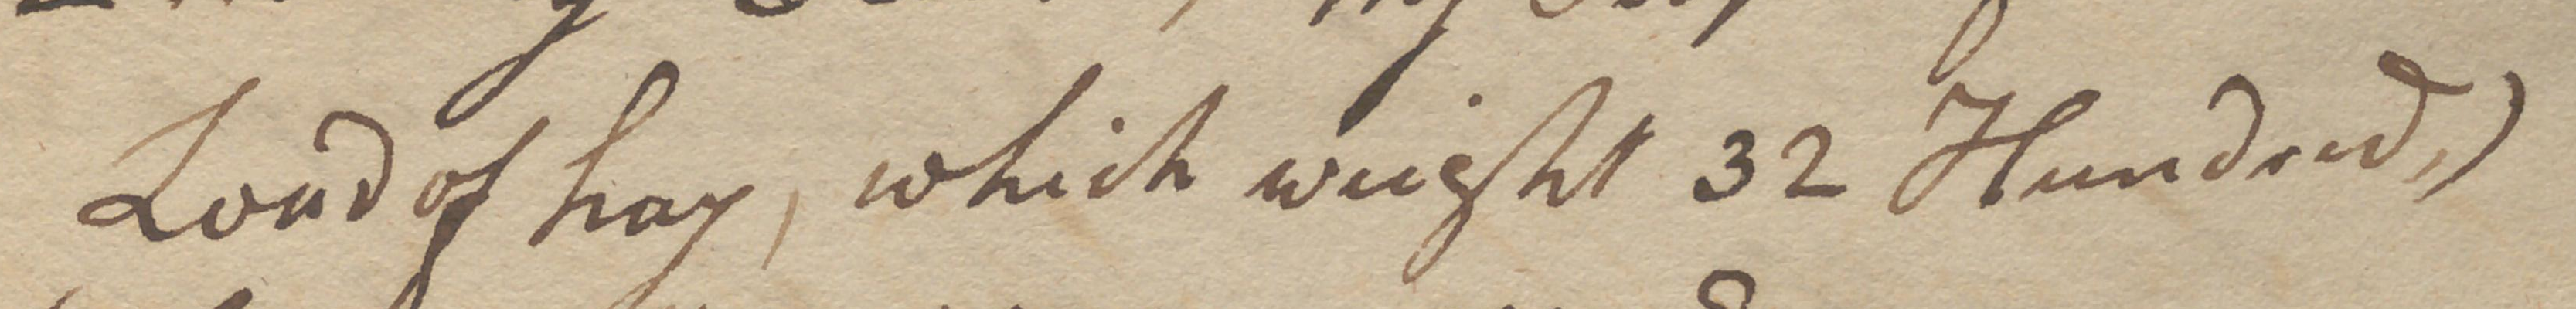Load of hay, which weight 32 Hundred,
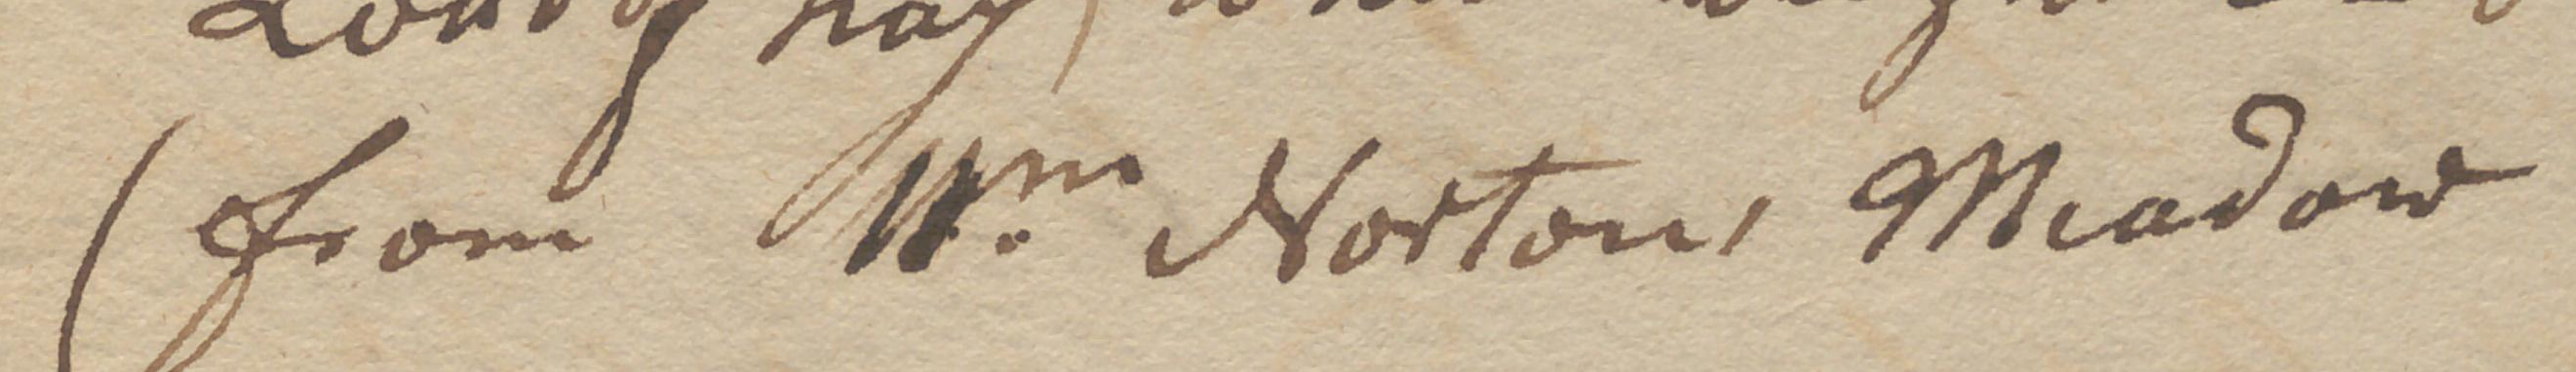(from W^m. Nortons Meadow
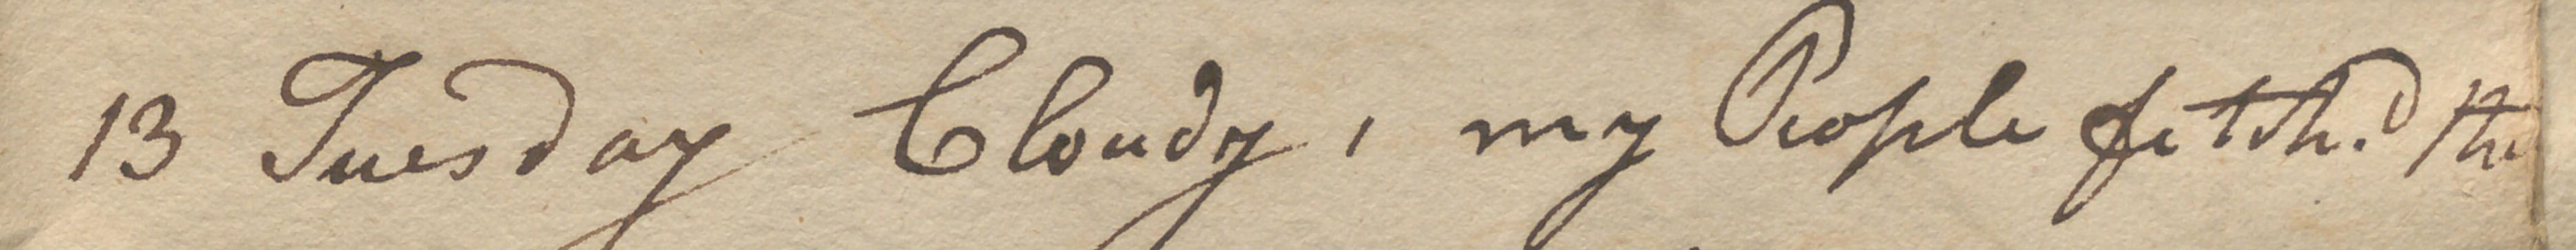13 Tuesday Cloudy, my People fetch^d. the
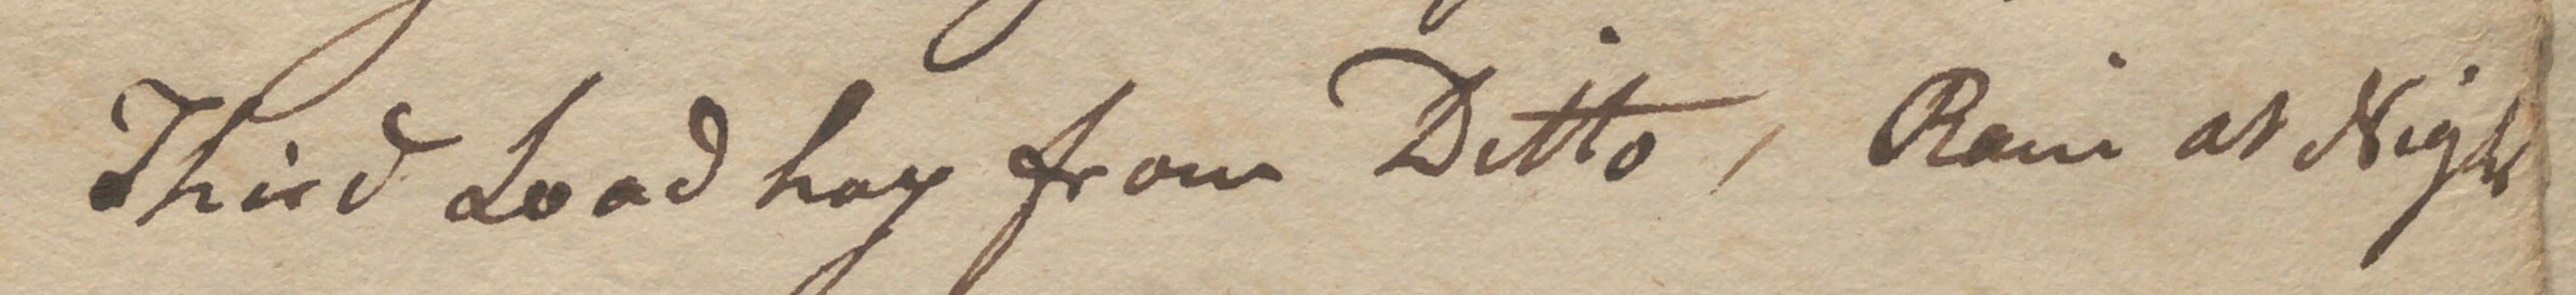Third Load hay from Ditto, Rain at Night
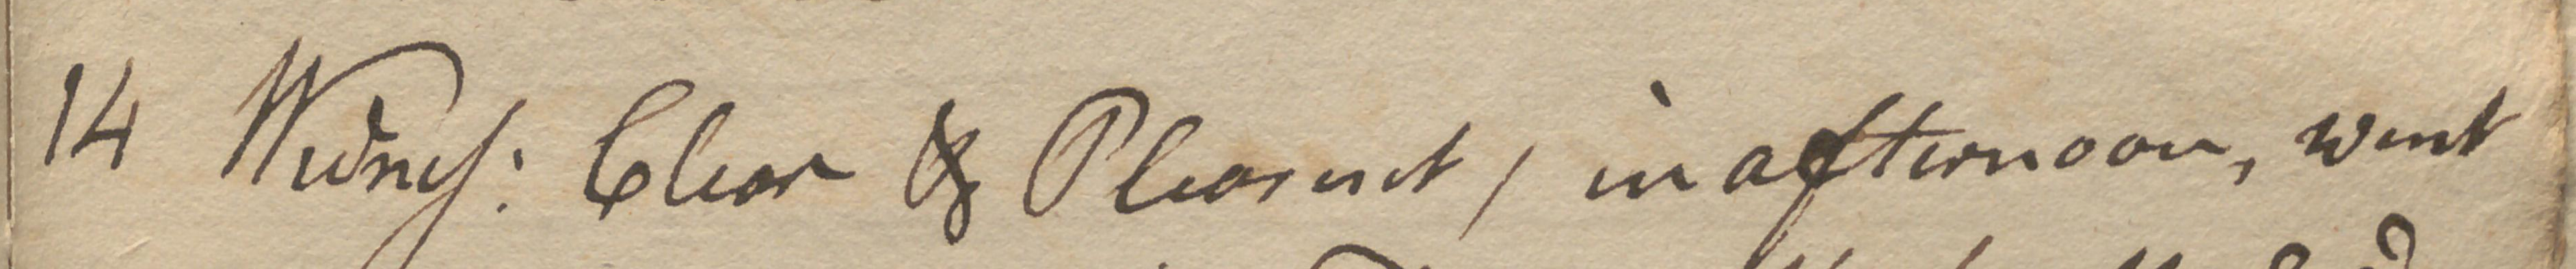14 Wednes: Clear & Pleasent, in afternoon, went
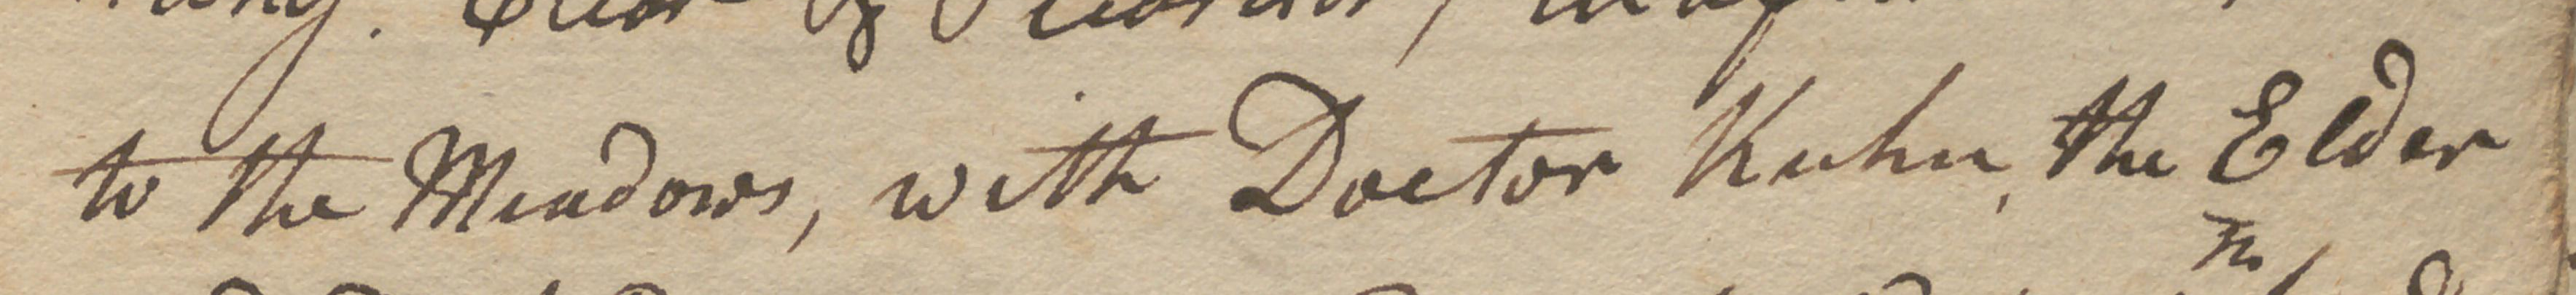to the Meadows, with Doctor Kuhn the Elder
